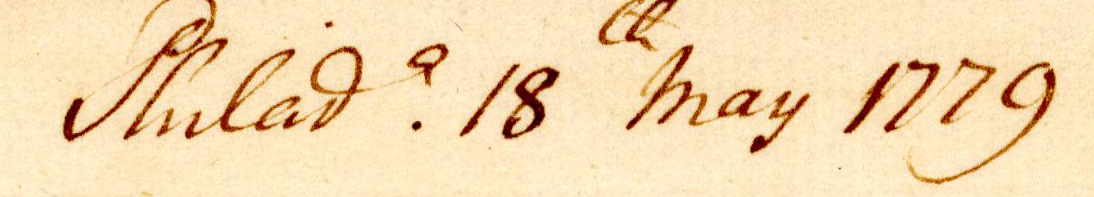Philad^a. 18^th May 1779
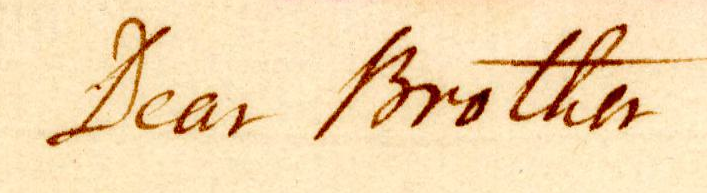Dear Brother
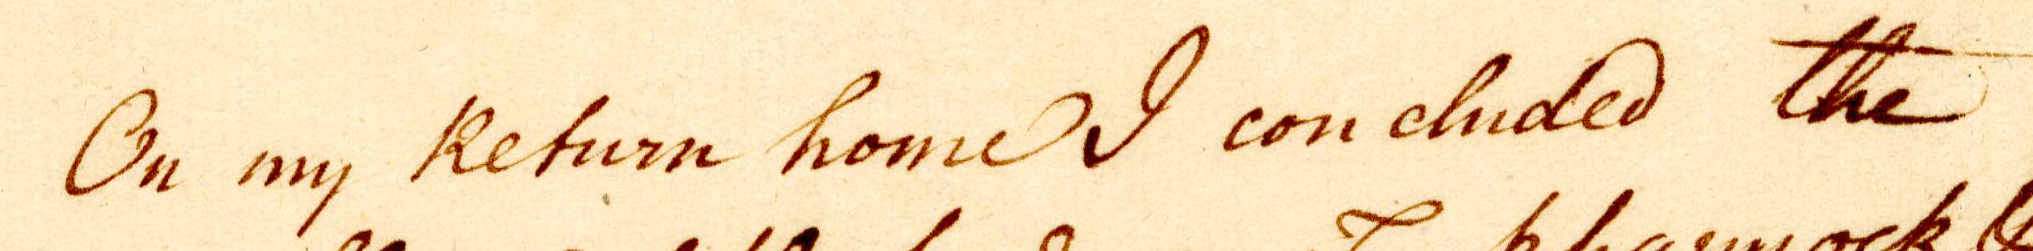On my Return home I concluded the
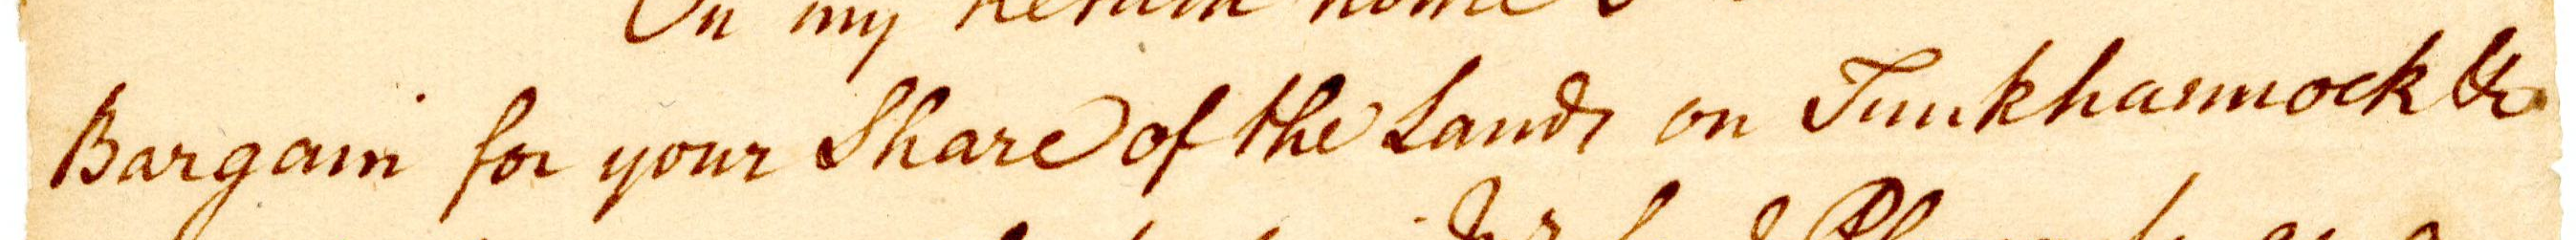Bargain for your Share of the Lands on Tunkhannock &
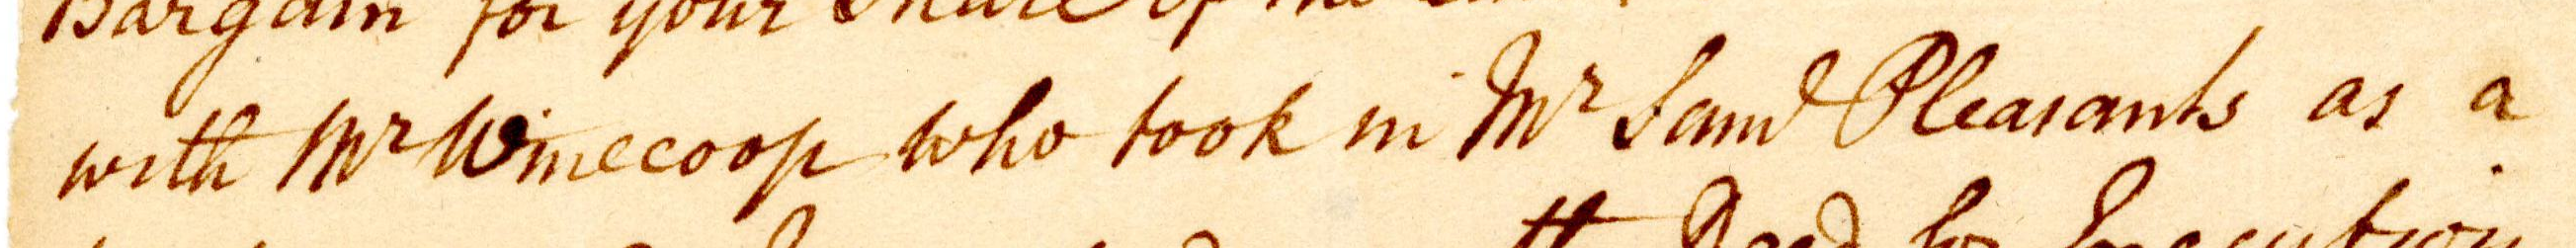with M^r Wincoop who took in M^r Sam^l Pleasants as a
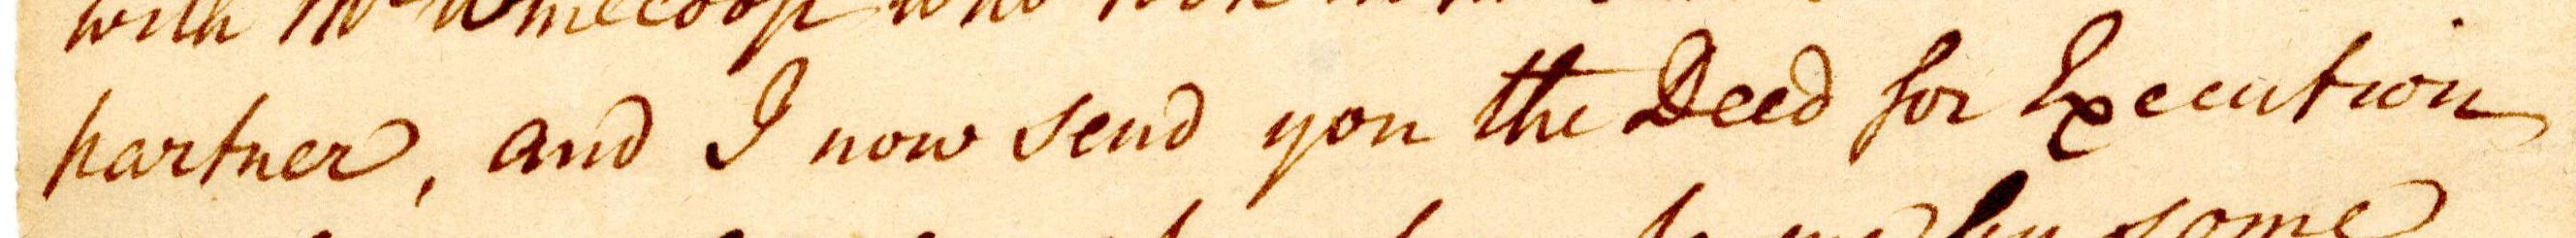partner, and I now send you the Deed for Execution
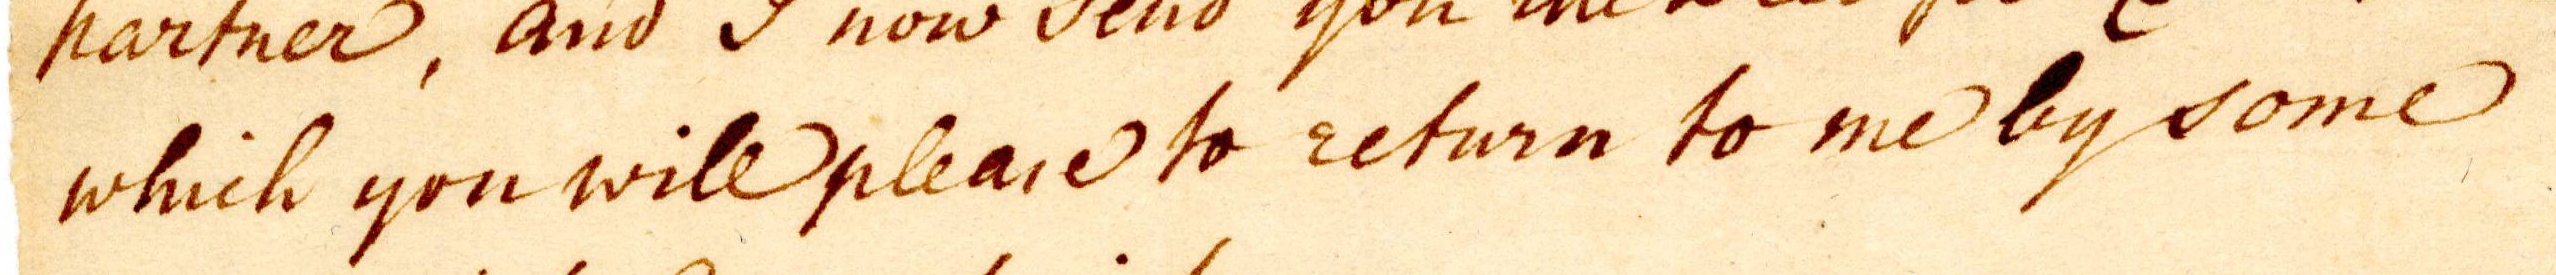which you will please to return to me by some
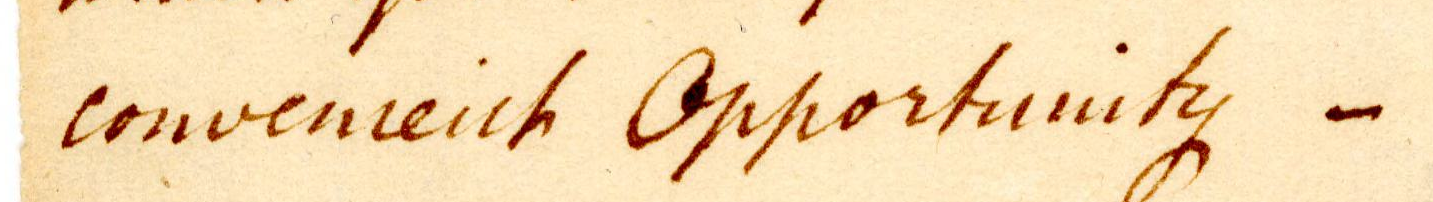conveneint Opportunity-
